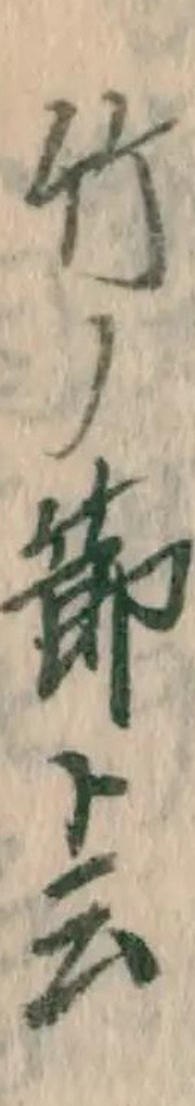竹ノ節ト云
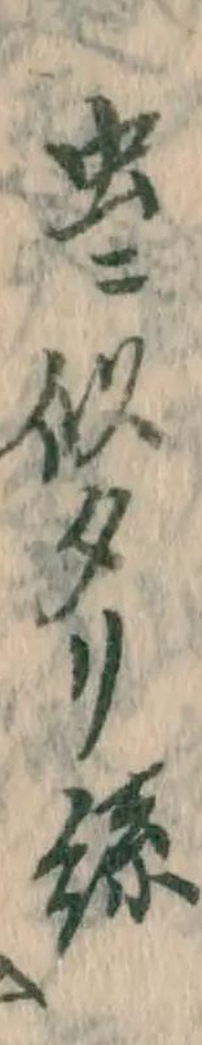虫ニ似タリ絲
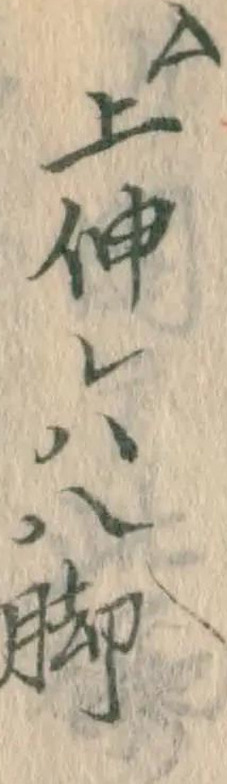上伸レハ八脚
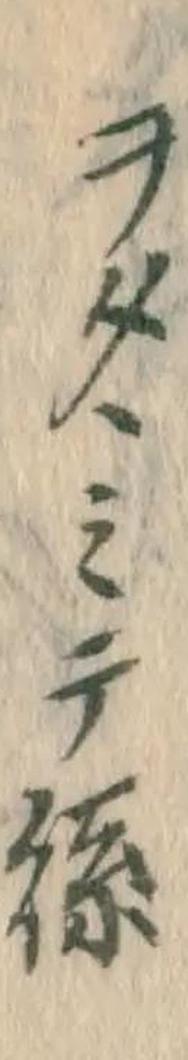ヲタヽミテ絲
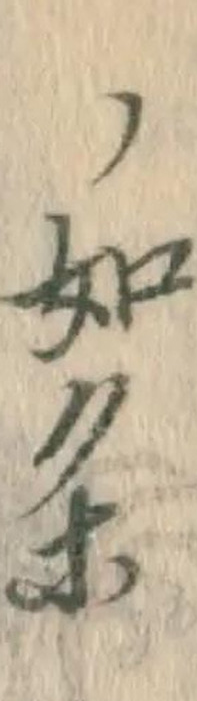ノ如クホ

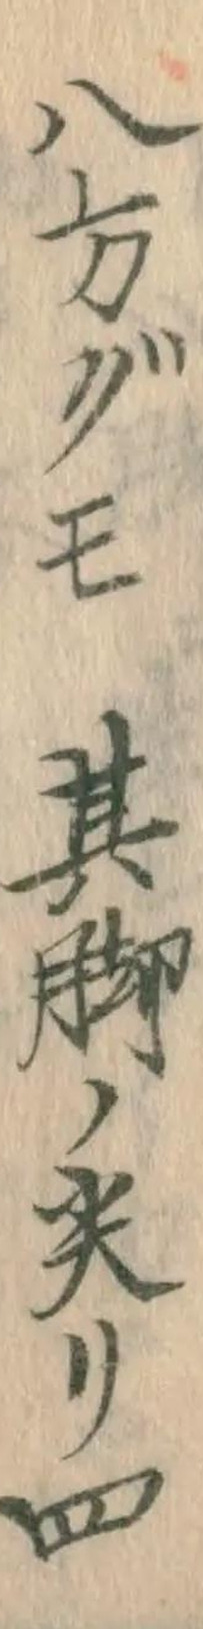八方グモ其脚ノ尖リ四
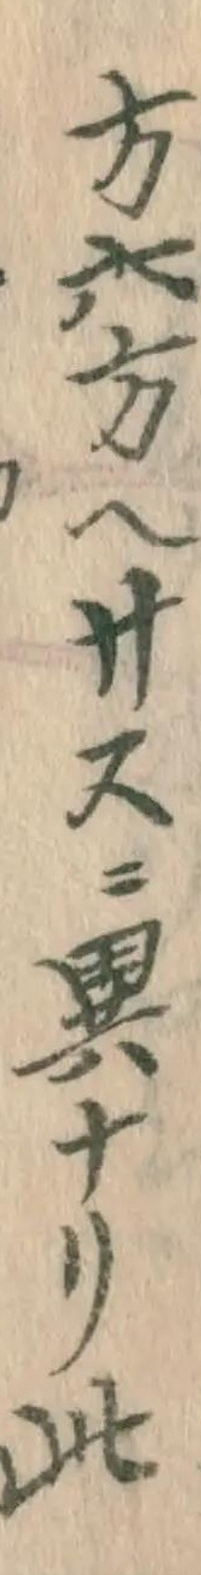方六方ヘサスニ異ナリ此
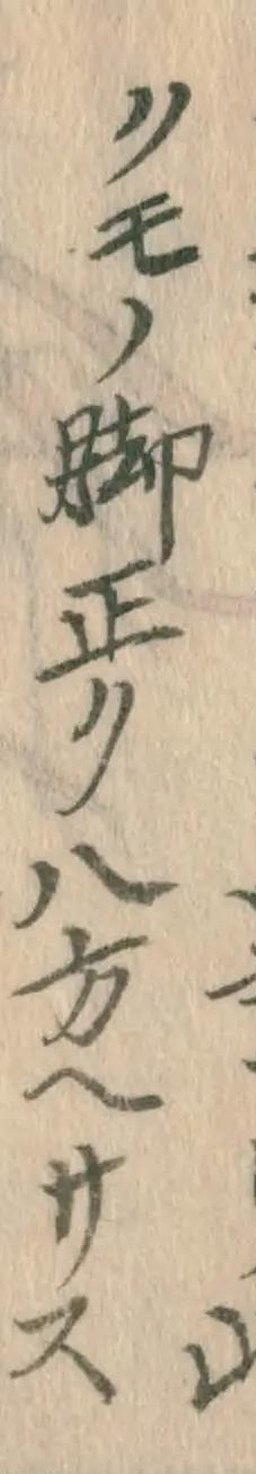クモノ脚正ク八方ヘサス
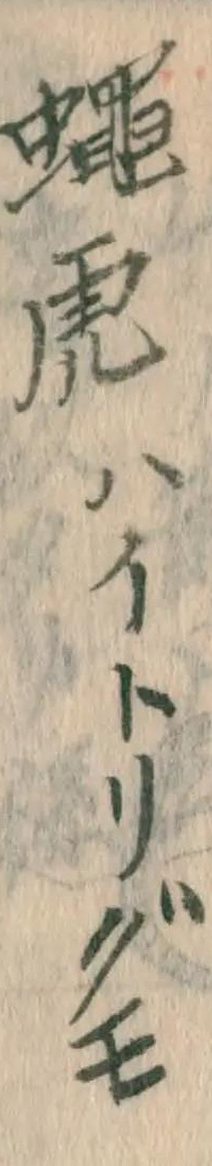蠅虎ハイトリグモ
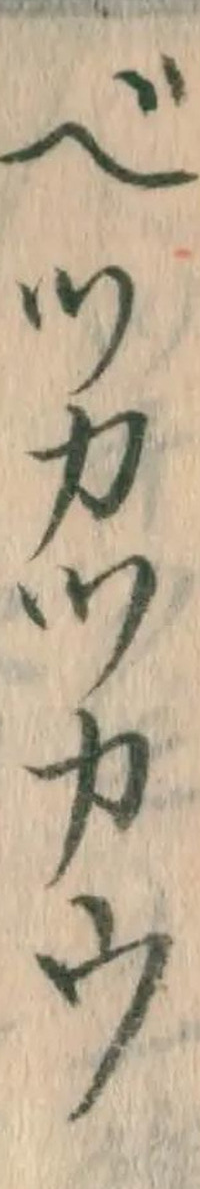ベツカツカウ
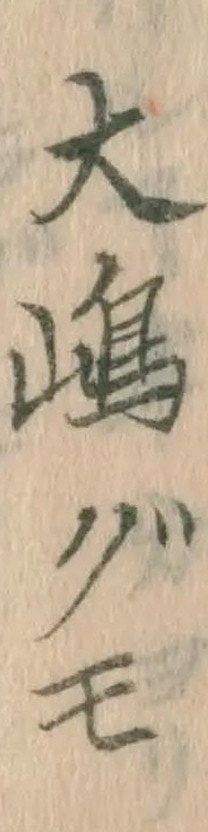大嶋グモ
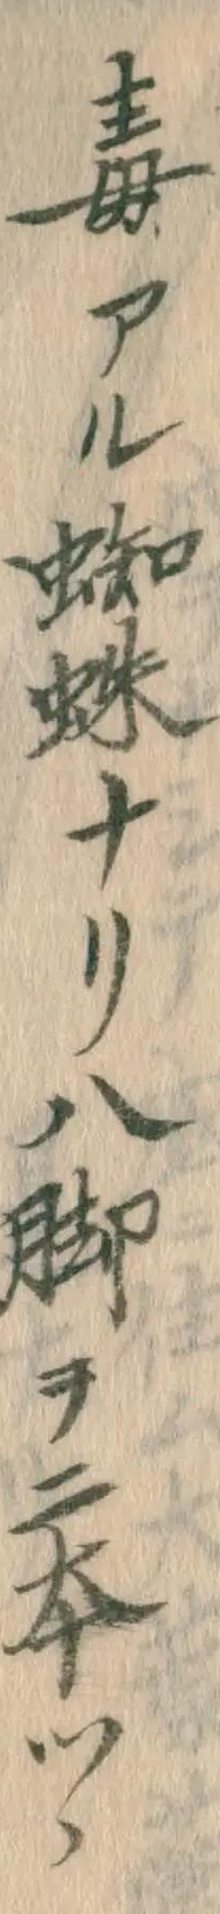毒アル蜘蛛ナリ八脚ヲ二本ツヽ
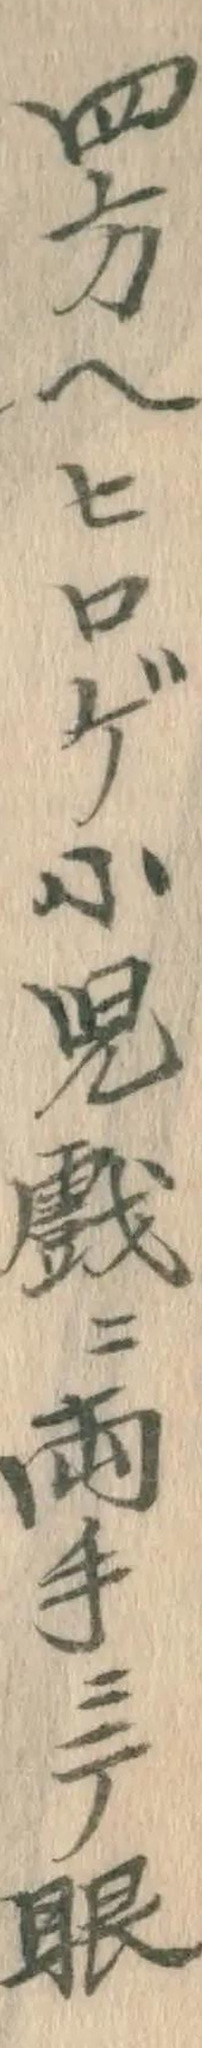四方ヘヒロゲ小児戯ニ両手ニテ眼
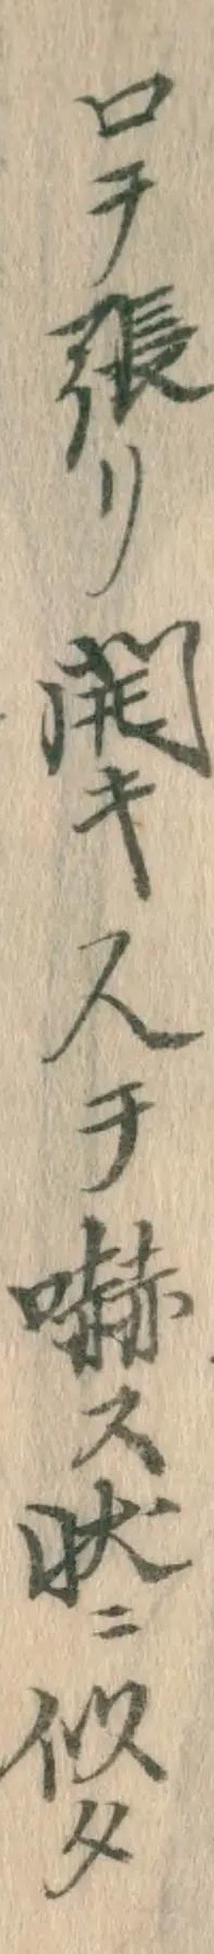口ヲ張リ開キ人ヲ嚇ス状ニ似タ
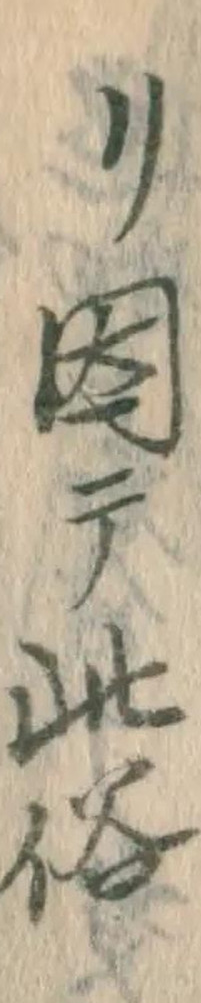リ因テ此俗
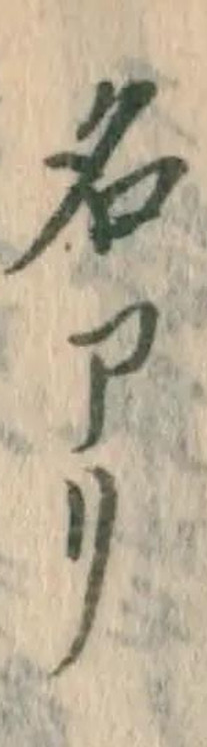名アリ
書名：千蟲譜 3巻. [2]
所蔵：国立国会図書館 National Diet Library, JAPAN
